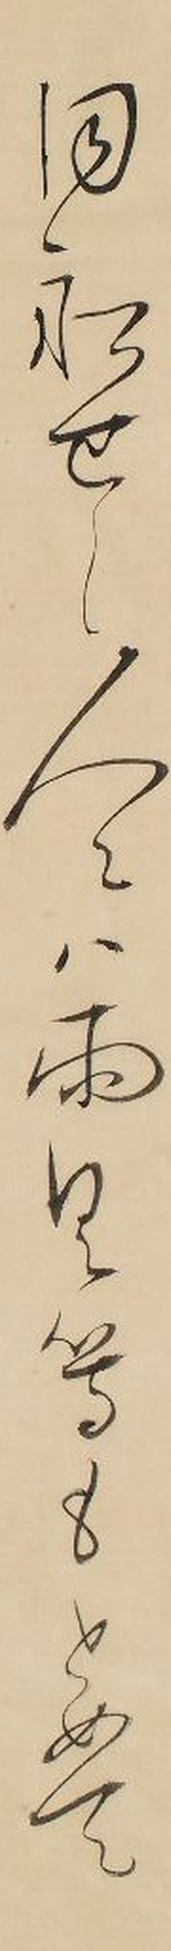同船せし人々は雨具等もとめて
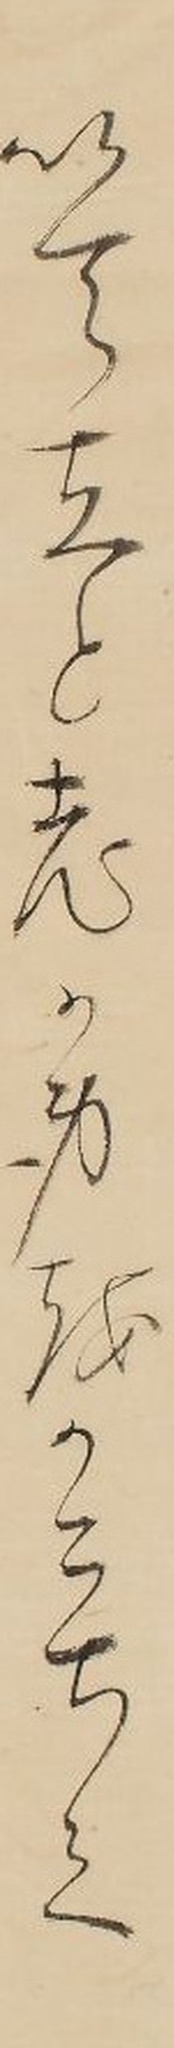いて立と老か身をかこちて
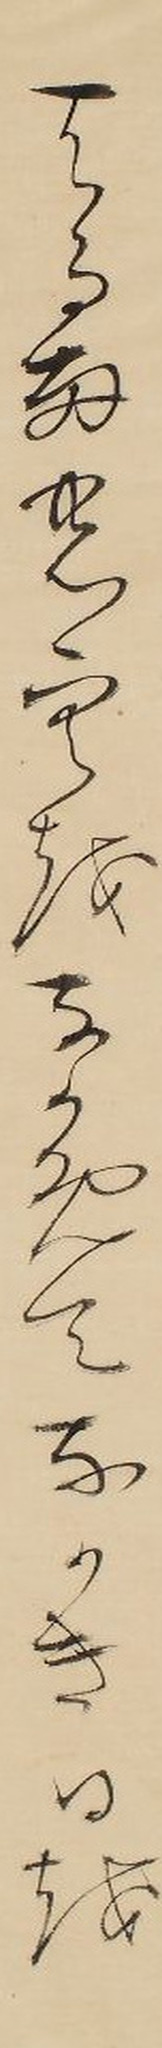はる雨の空をなかめてなかき日を
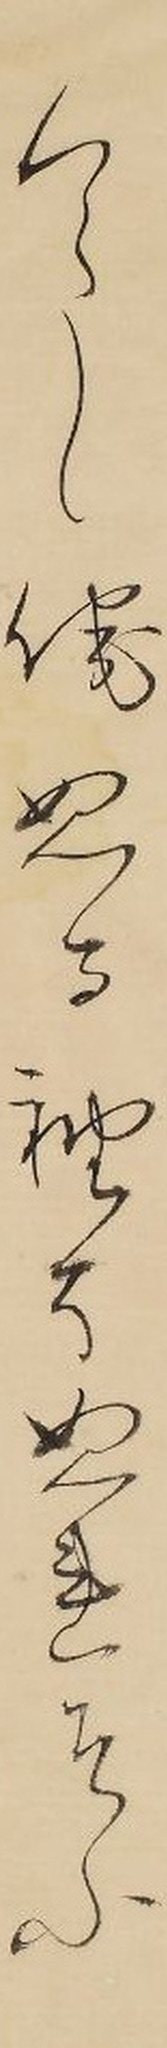くらし侘ぬる袖そぬれそふ
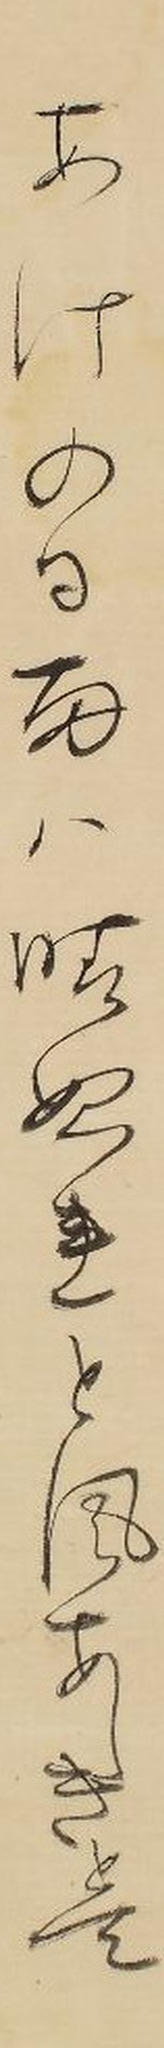あけの日雨は晴ぬれと風あしきとて
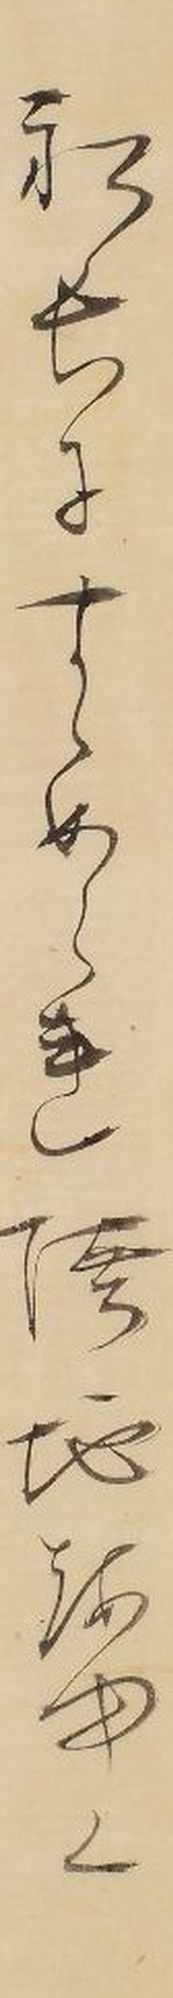船長にすゝめられ陸地をゆく
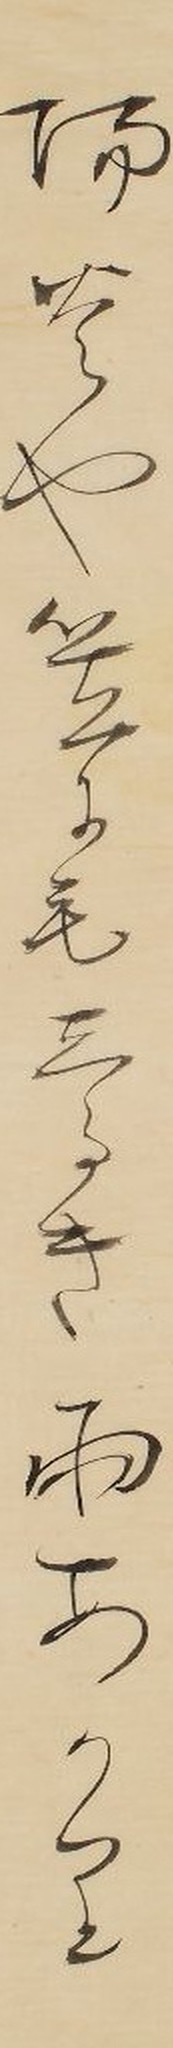陽炎や笠にもしるき雨あかり
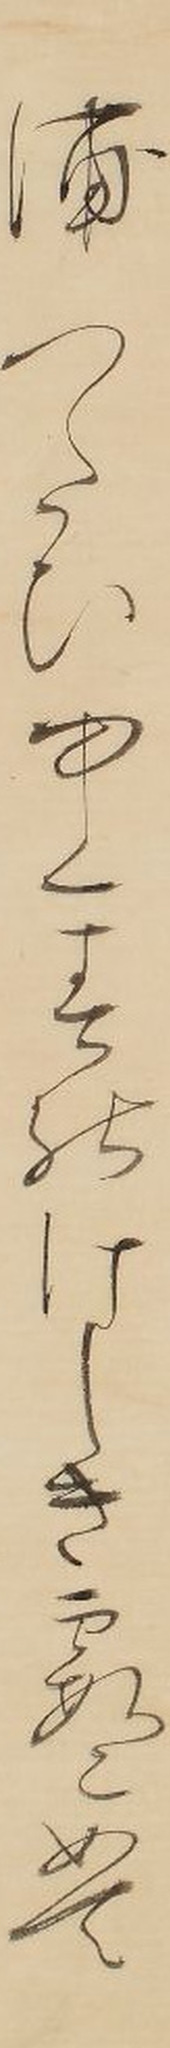浦つたひゆく春のけしき霞こめて
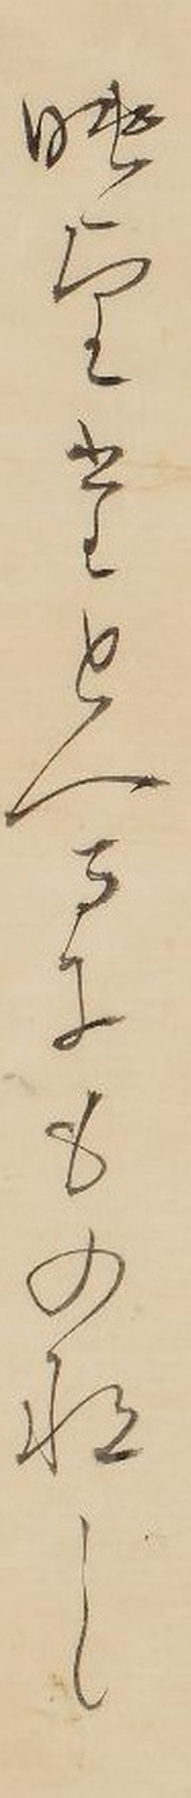眺望たとへるにものなし
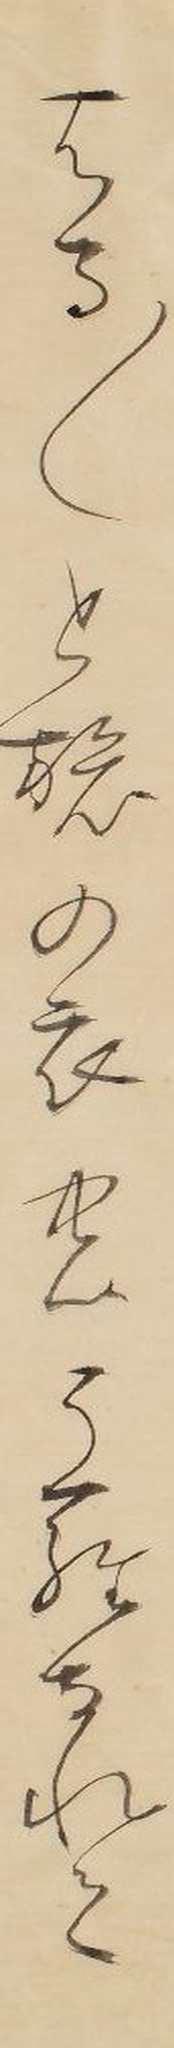はる〳〵と旅の衣のそらなれて
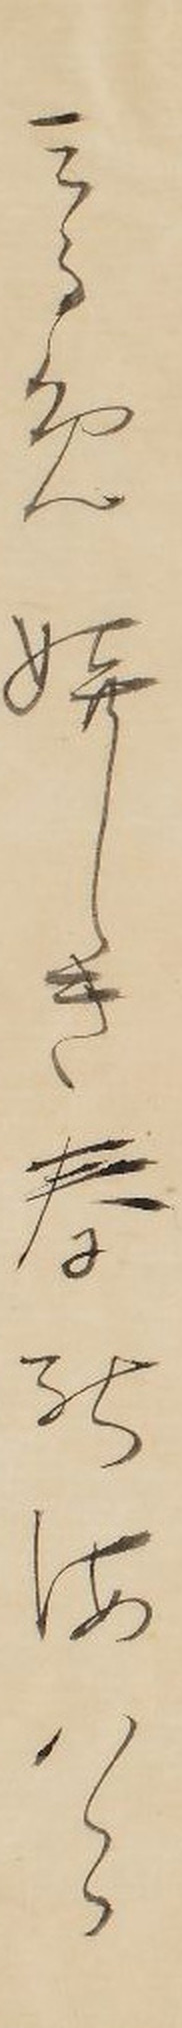みるめ嬉しき春の海はら
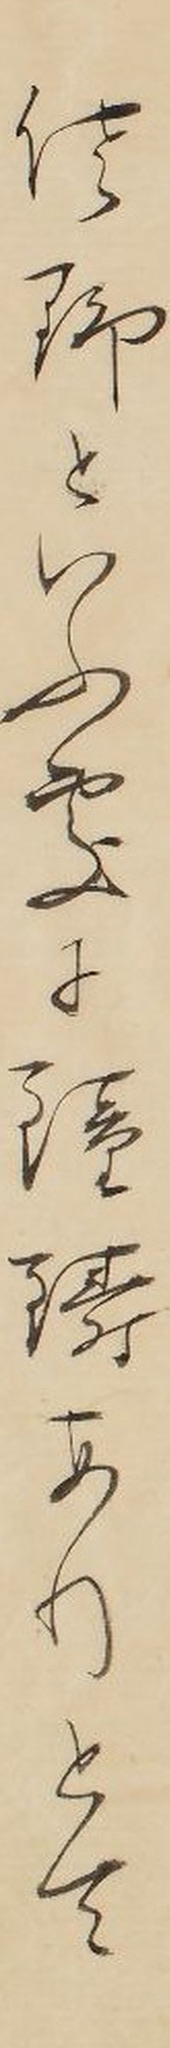佐野といふ処に鐘鋳ありとて
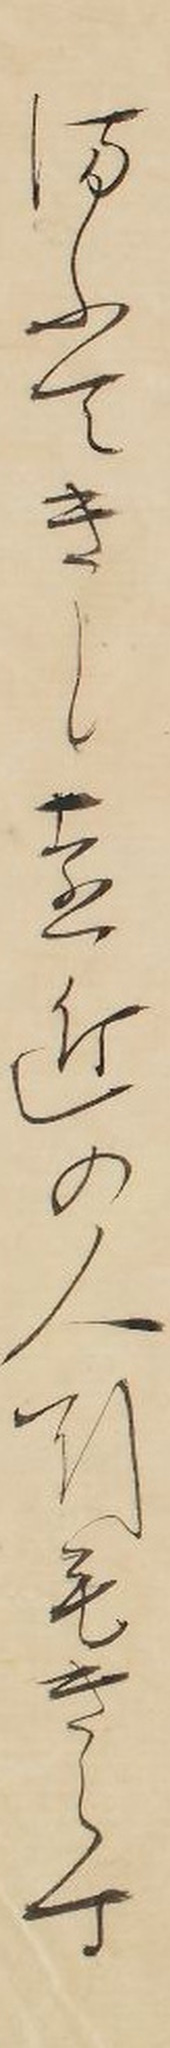まふてきし遠近の人引もきらす
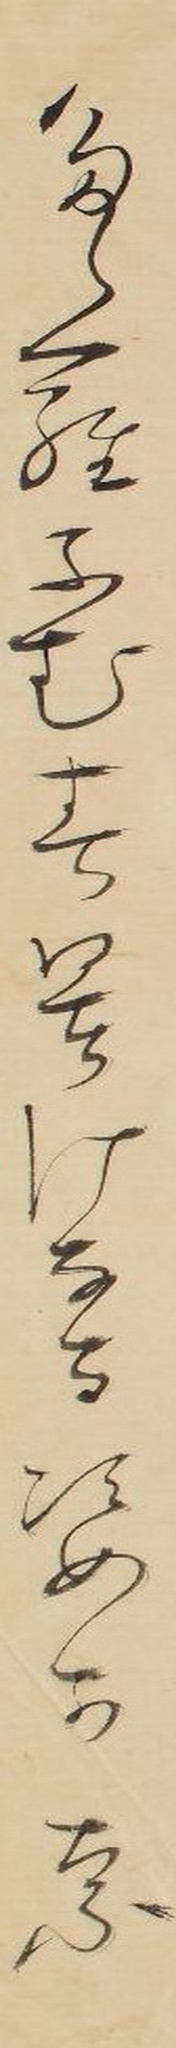たゝらふむ春暑けなる姿かな

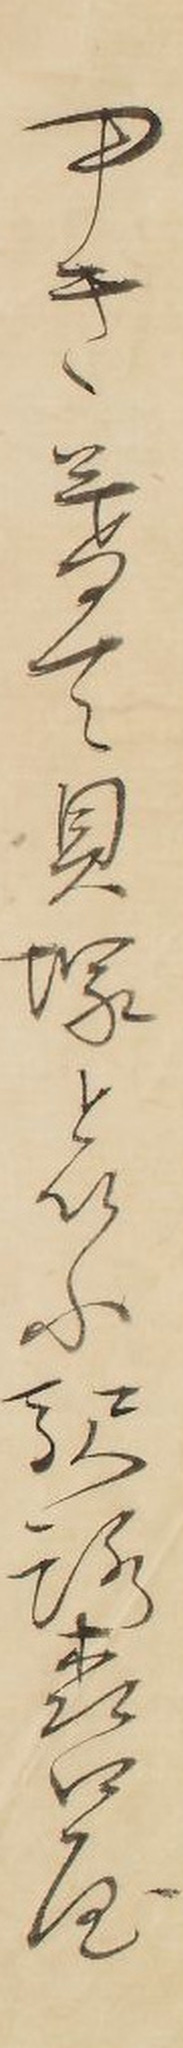ゆき暮て貝塚といふ駅路森口屋
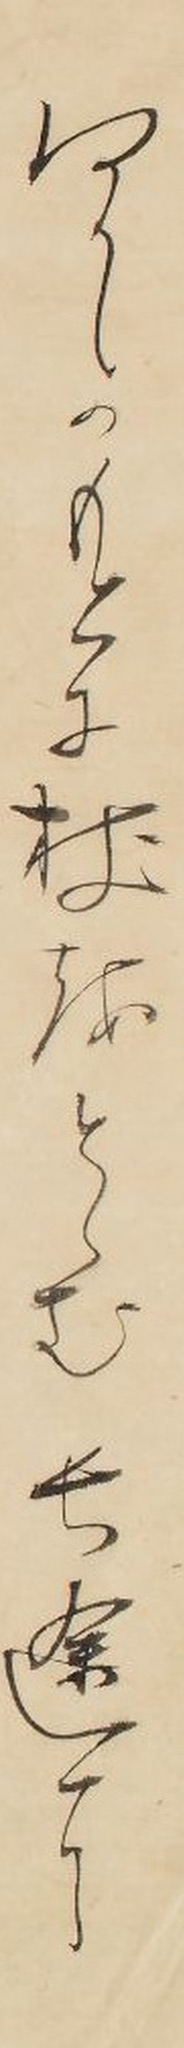何かしかもとに杖をとゝむ長途に
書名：花土産
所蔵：徳島県立図書館
